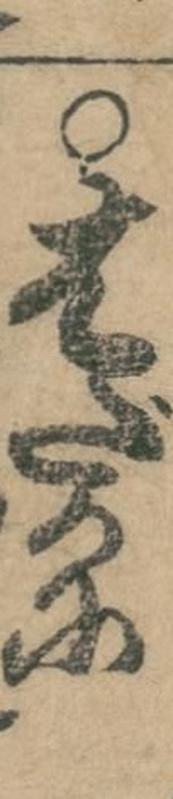◯はだかに
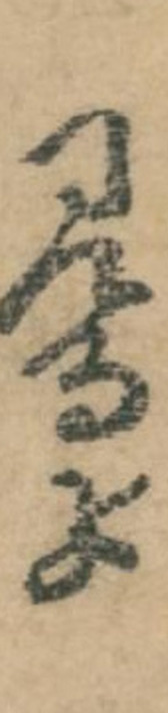見るよ
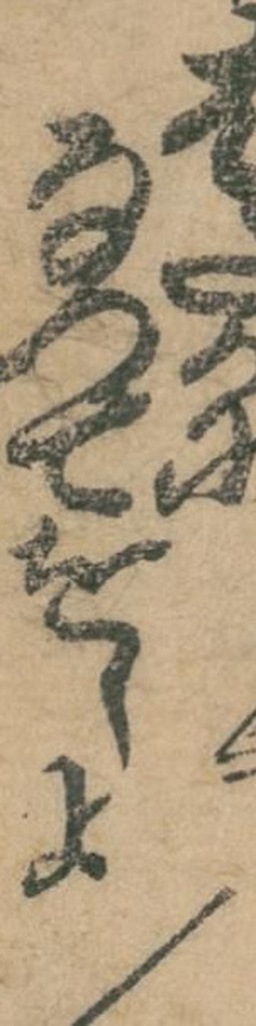なつてをしよ
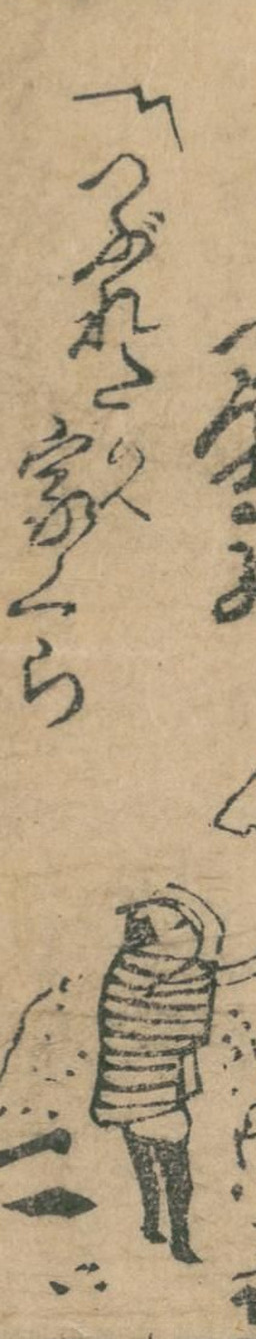〽つぶれた家くら
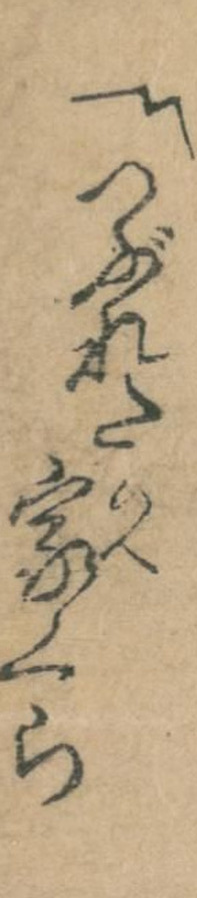〽つぶれた家くら
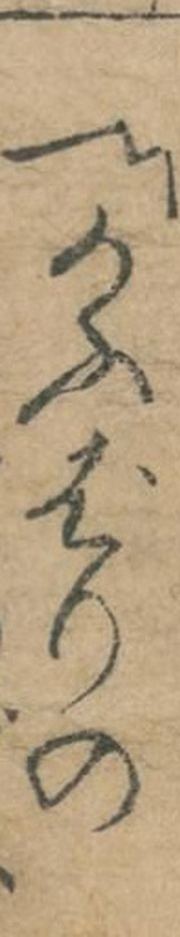〽かふはりの
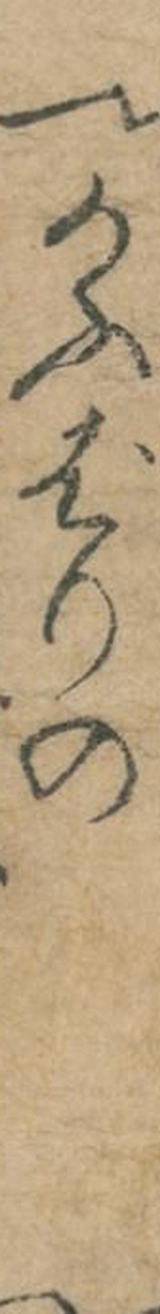〽かふはりの
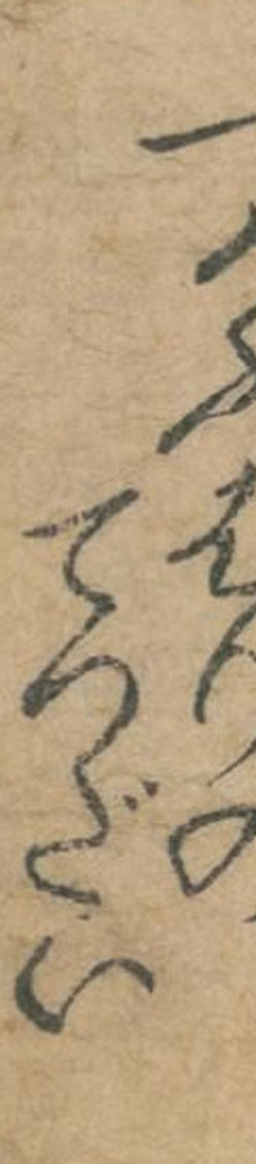てつだい
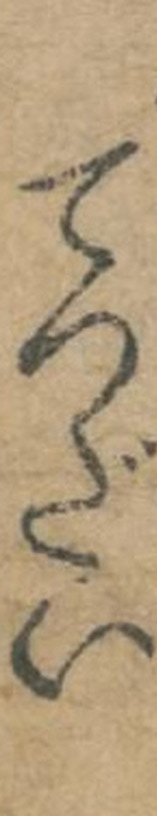てつだい
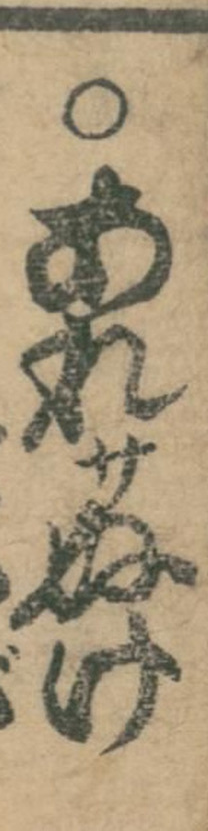◯あれサぬけ
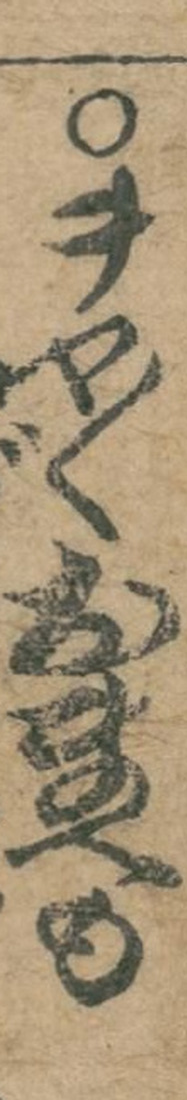◯ヲヤ〳〵おまへも
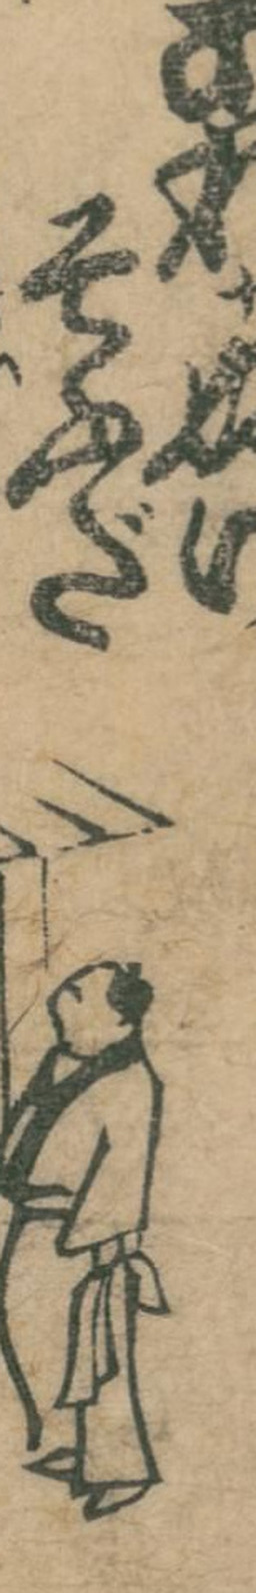そふだ
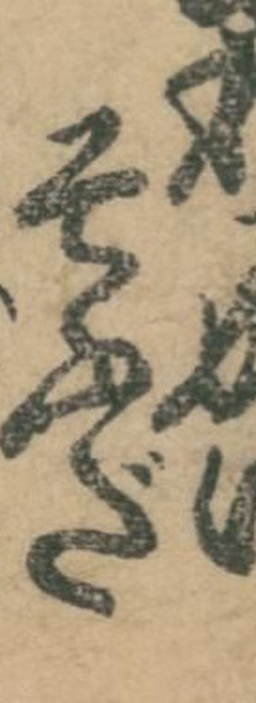そふだ
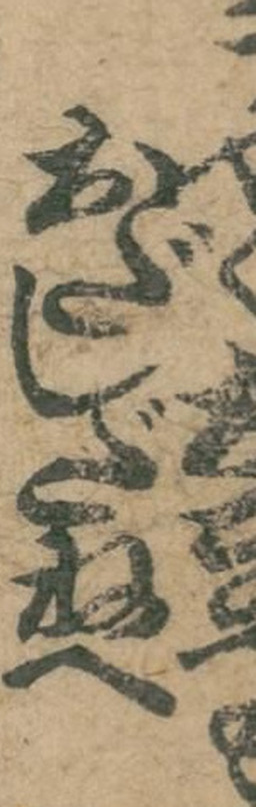おだしだねへ
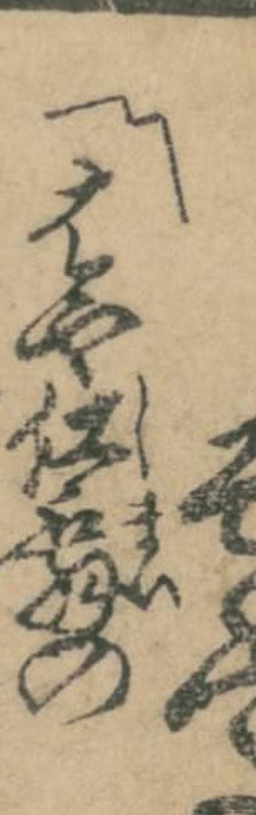〽はや仕舞の
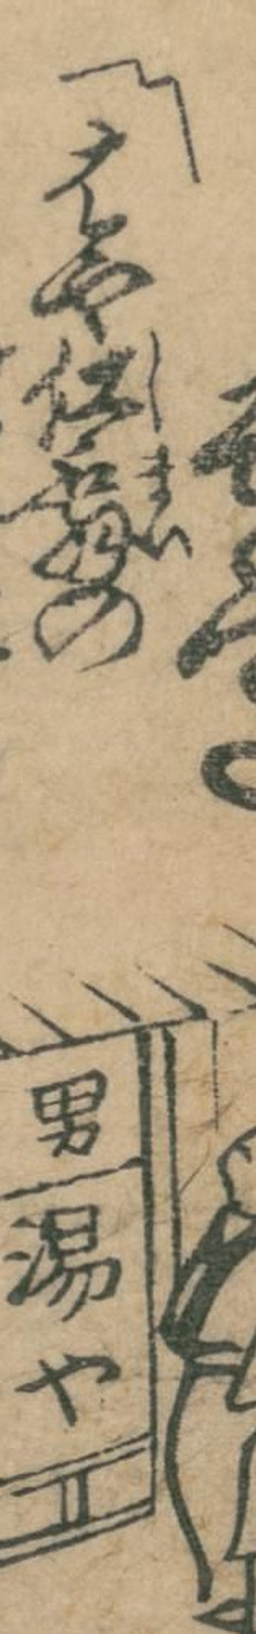〽はや仕舞の
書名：地震出火　例のおわらひ
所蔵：東京大学地震研究所図書室 Earthquake Research Institute Library, The University of Tokyo, JAPAN
